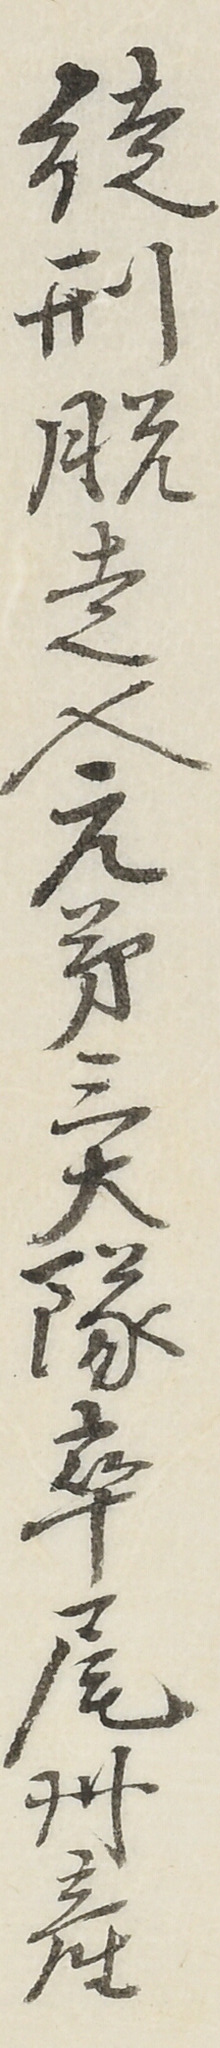徒刑脱走人元弟三大隊卒尾州産
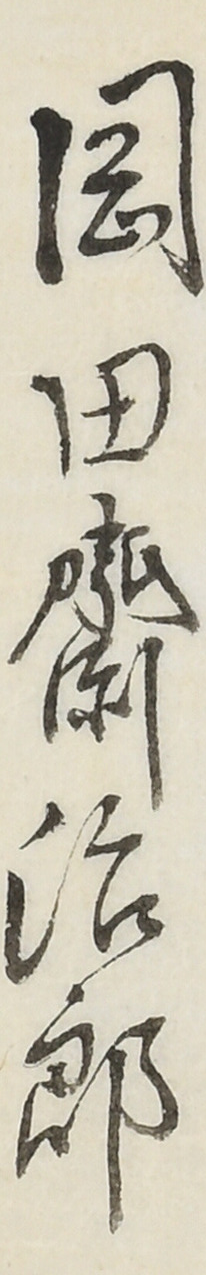岡田齋治郎
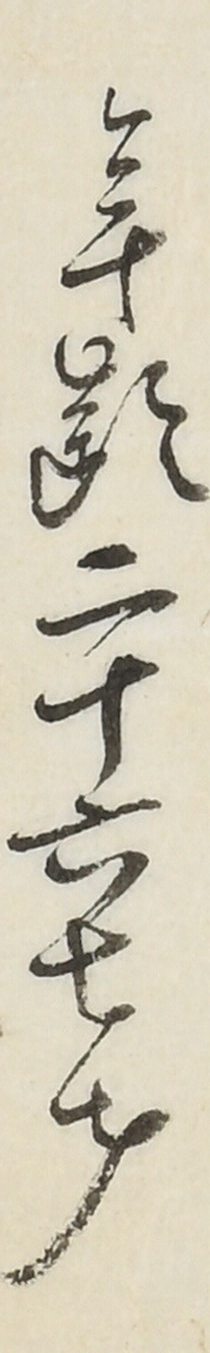年齢二十六七才

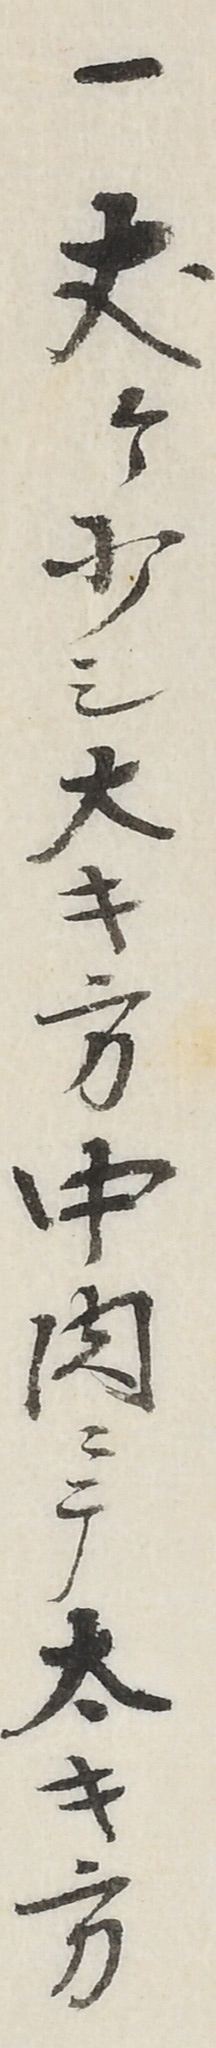一丈ヶ少シ大キ方中肉ニテ太キ方
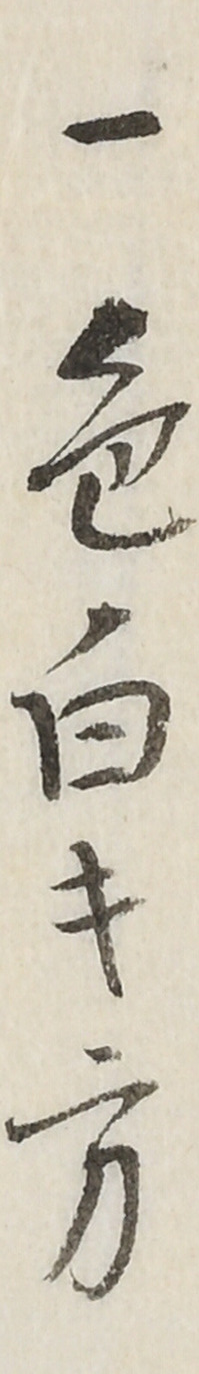一色白キ方
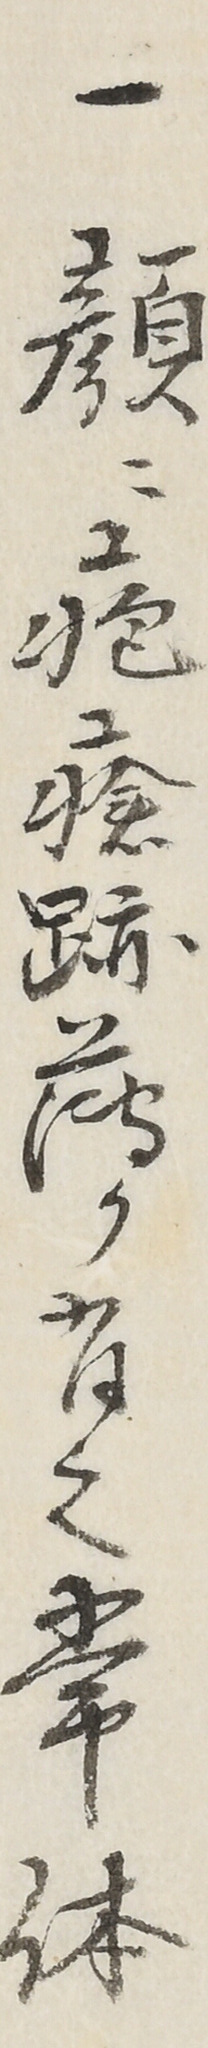一顔ニ疱瘡跡薄ク有之常体
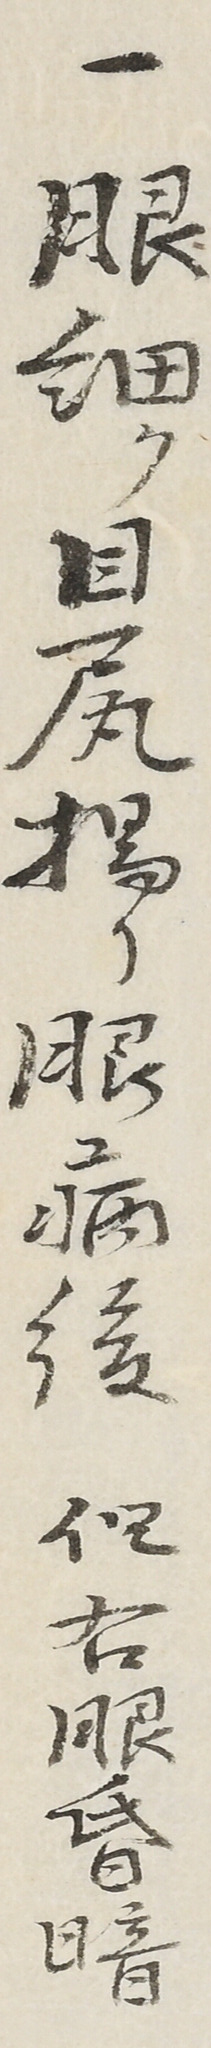一眼細ク目尻揚リ眼病後但右眼昏暗
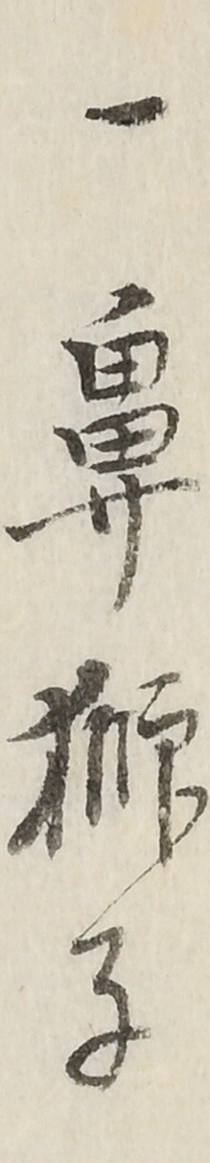一鼻獅子
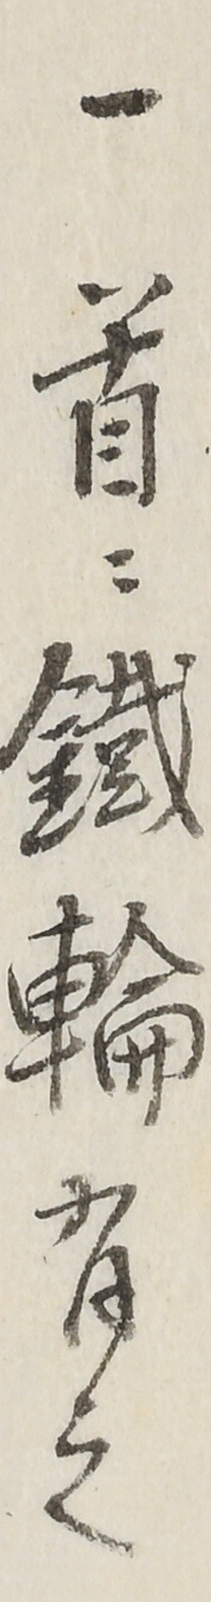一首ニ鉄輪有之
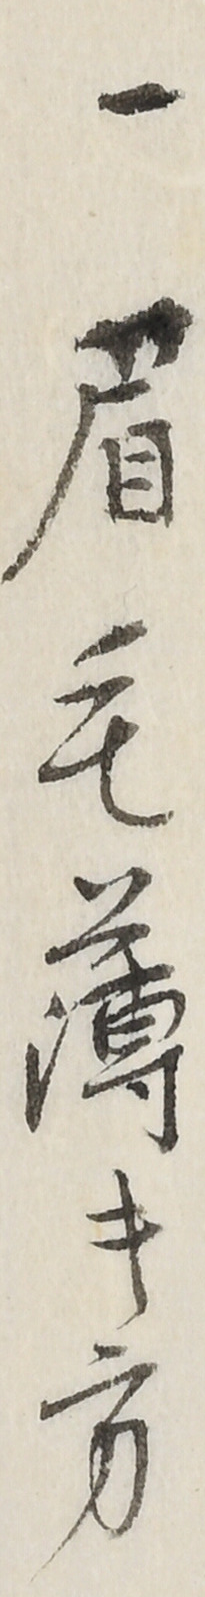一眉毛薄キ方
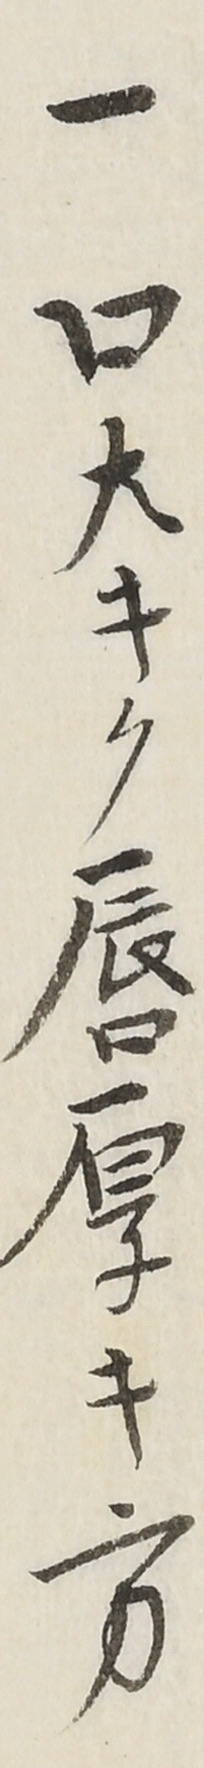一口大キク唇厚キ方
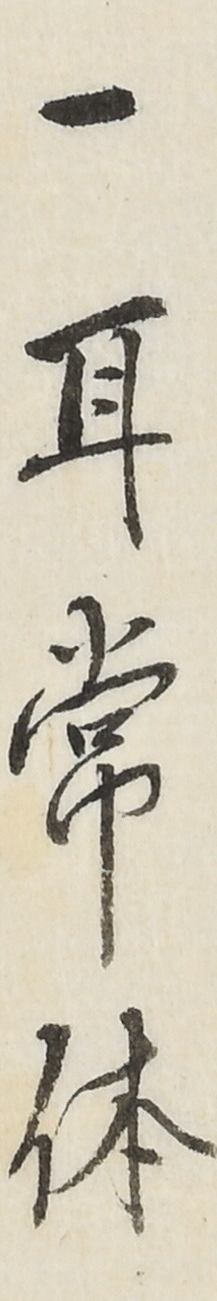一耳常体
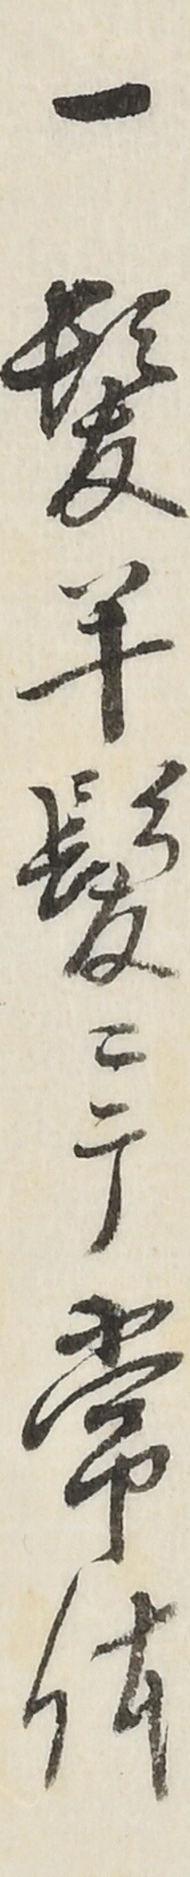一髪半髪ニテ常体
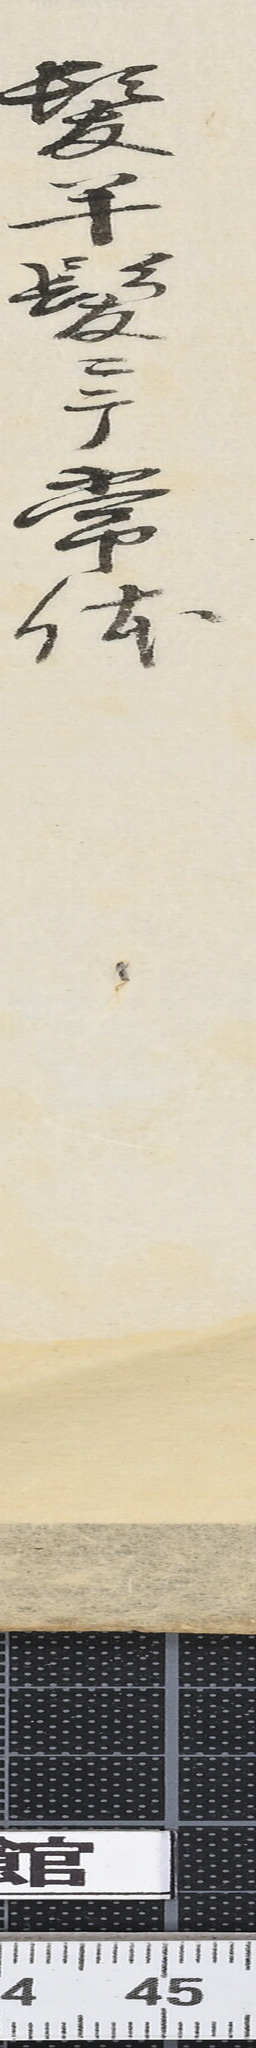一髪半髪ニテ常体
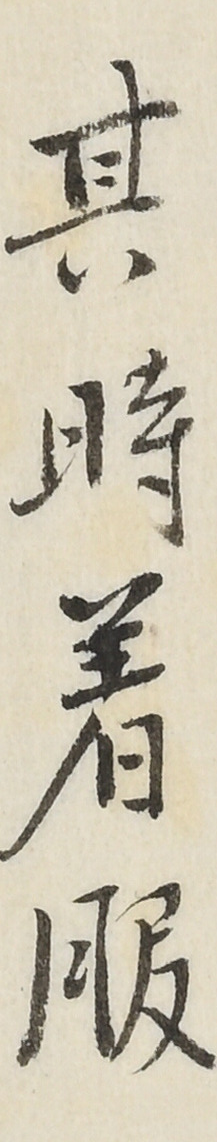其時着服
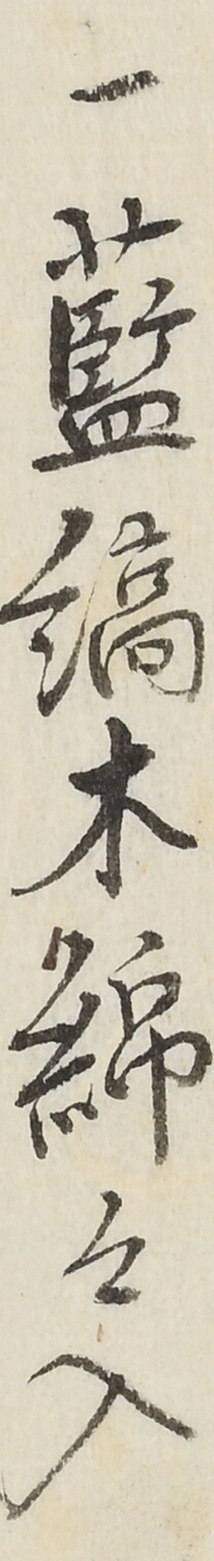一藍縞木綿々入
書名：廻状（控）
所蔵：伊那市立高遠町図書館・合同会社AMANE
